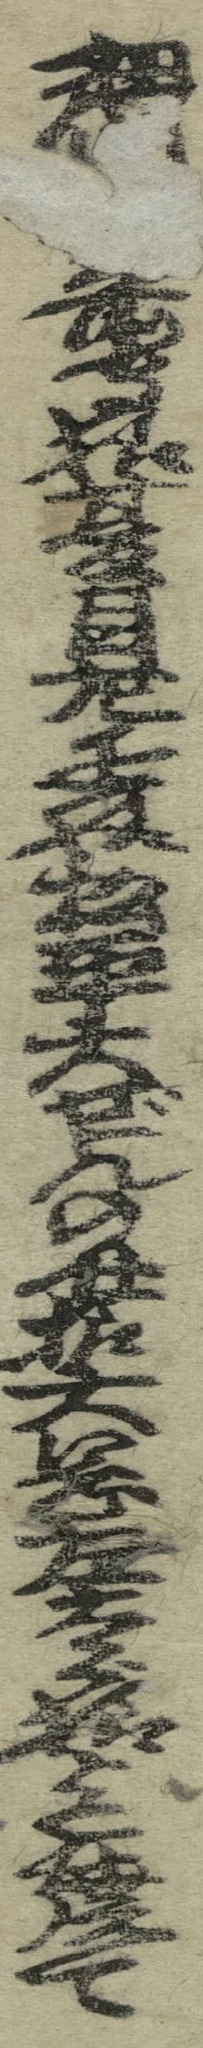細川豊前守様夏目左近様松平大ぜんの介様大岡左太郎様迄焼て
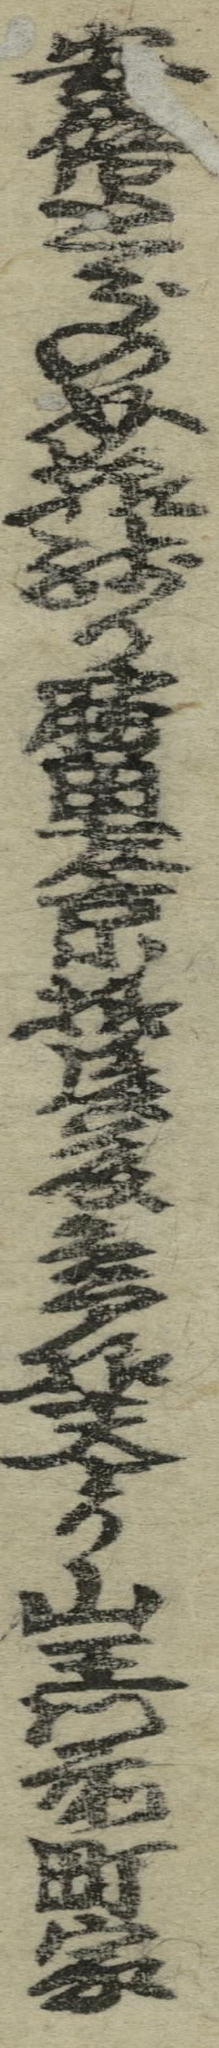安倍とらの介様残り勝田左京様後藤兵部様夫より山王門前町家
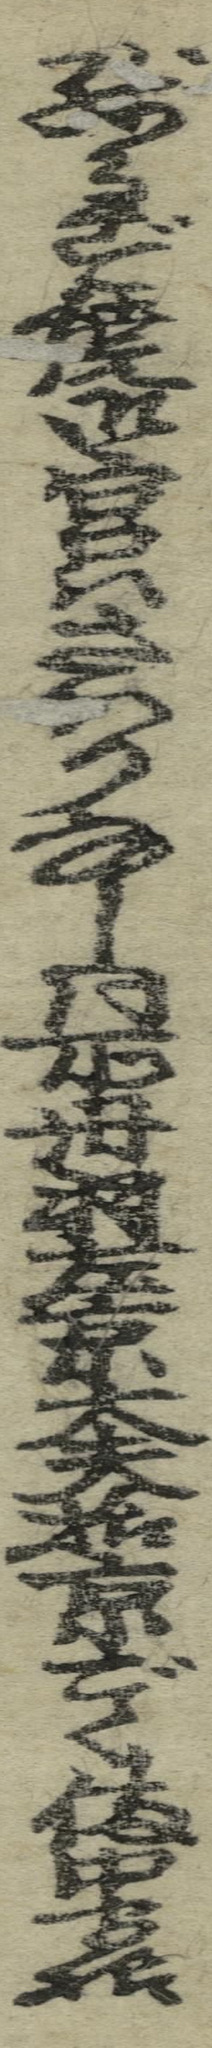残らず焼御宮はさはりなし同所丹羽左京大夫様京ごく備中守様
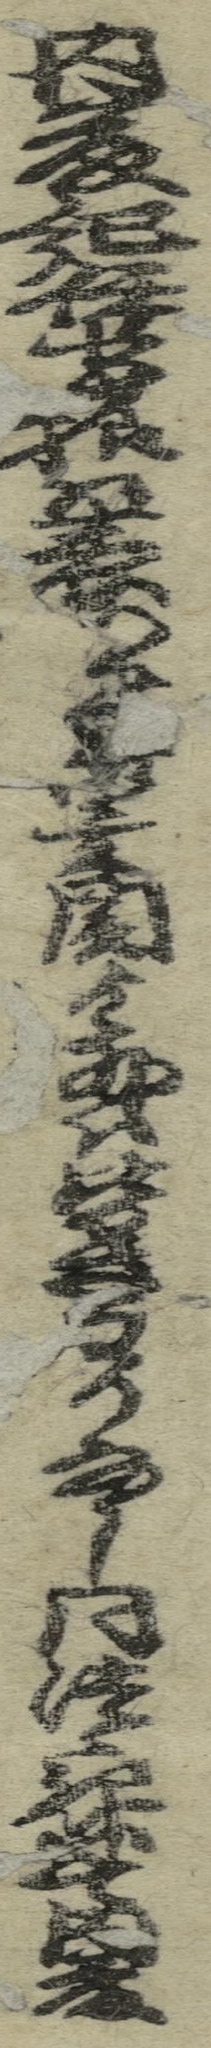内藤紀伊守様御表やしき御玄関ゟ外は皆さはりなし同つゝ部にて内藤
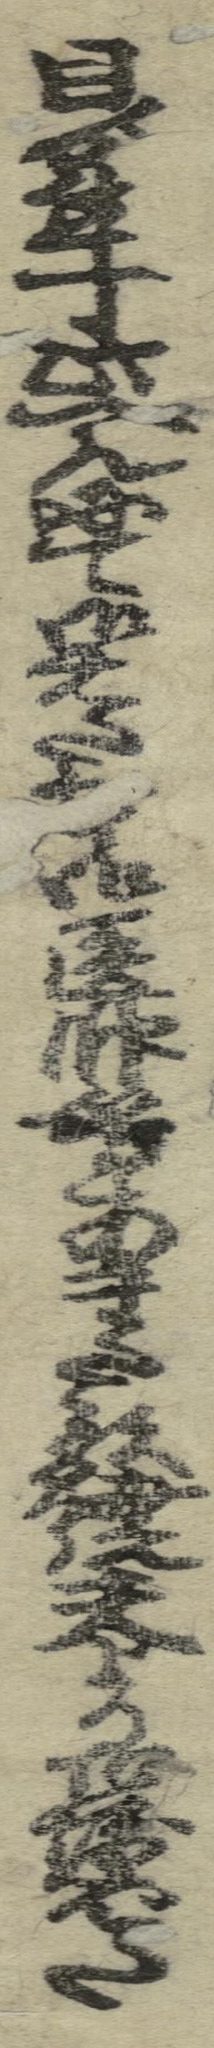目ゟ雀丁此へんにて御はた本様医師等あまた類焼夫より御堀はた
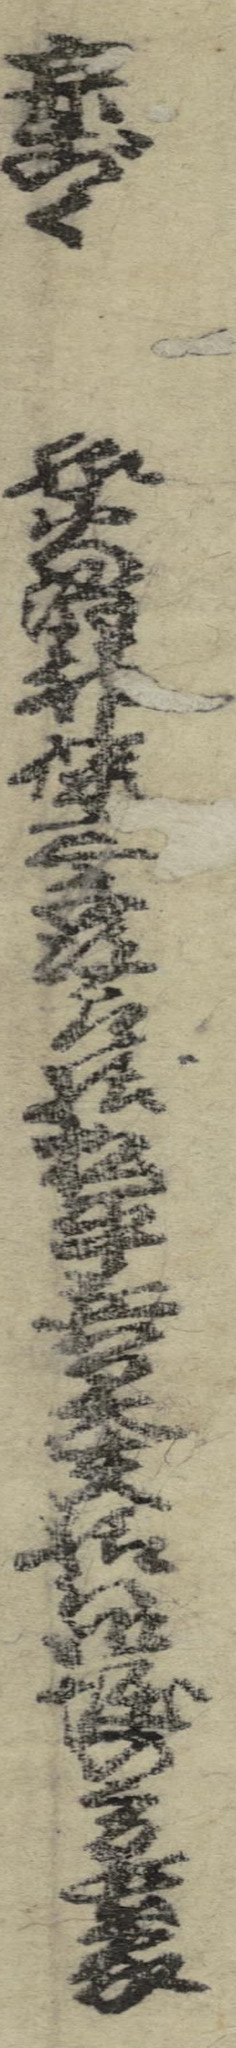寄ごく災難神保三千次郎様松平兵部大夫様は御堀の方長家
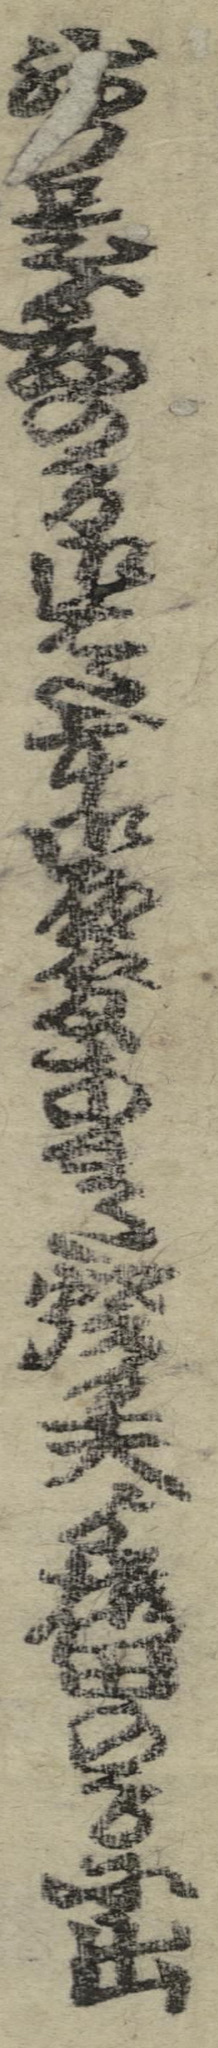残り是より西の方御はた本御屋敷あまた焼る夫ゟ桜田の方に出
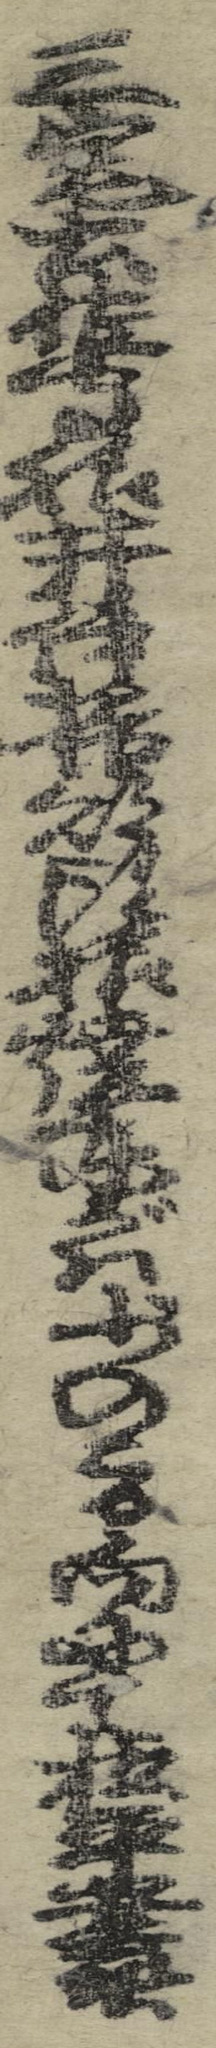三宅土佐守様井伊掃部頭様焼東がは少のこる向にて松平安芸
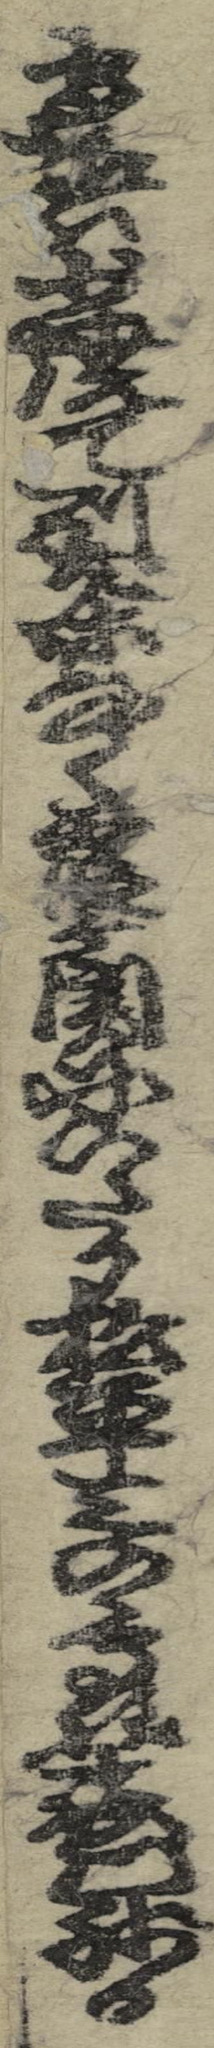守様は少焼て別条なく霞ケ関にいたり松平みの守様表門残る
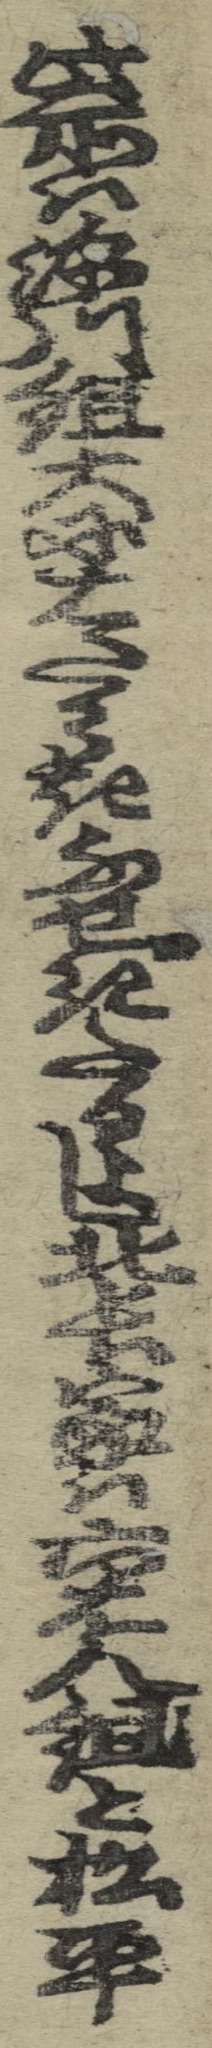此所は深川組大にはたゝきふせきたるよし北長家は六は八組と松平
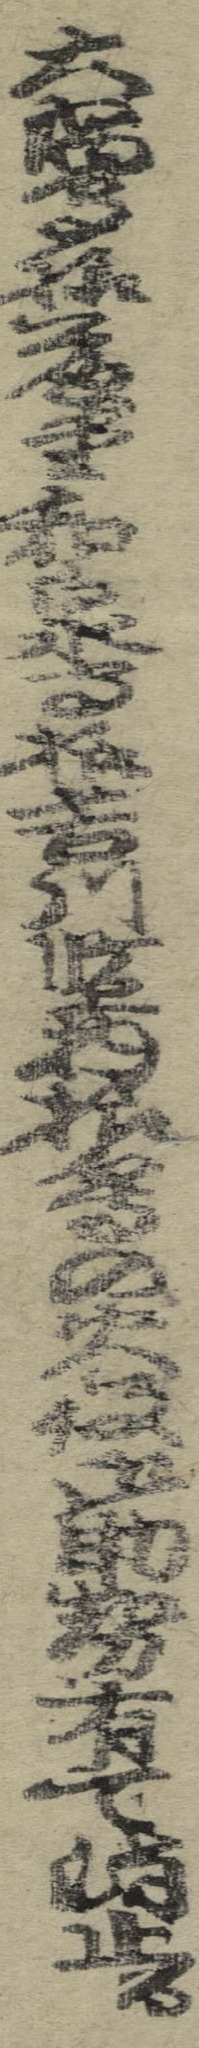大隅守様藤重和泉守様吉川監物様等の火役御助勢有て消止る
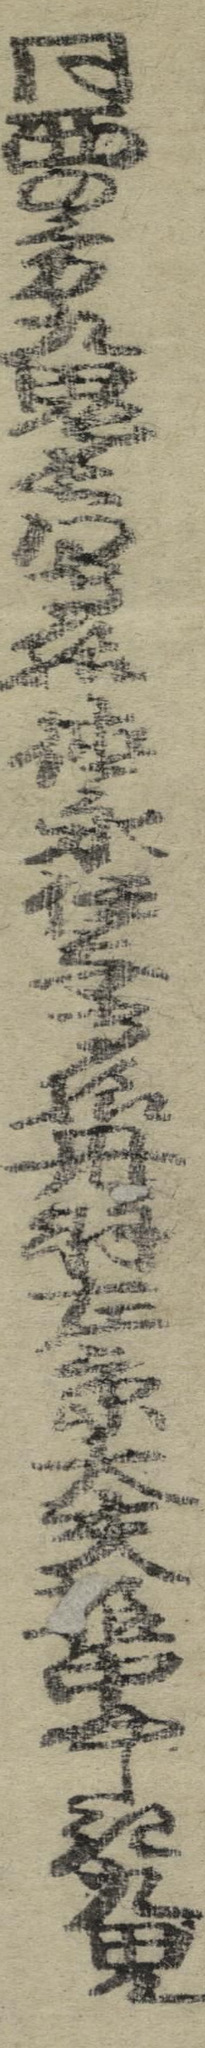同西の方九鬼長門守様徳永伊予守様丹羽左京大夫組中やしき九鬼
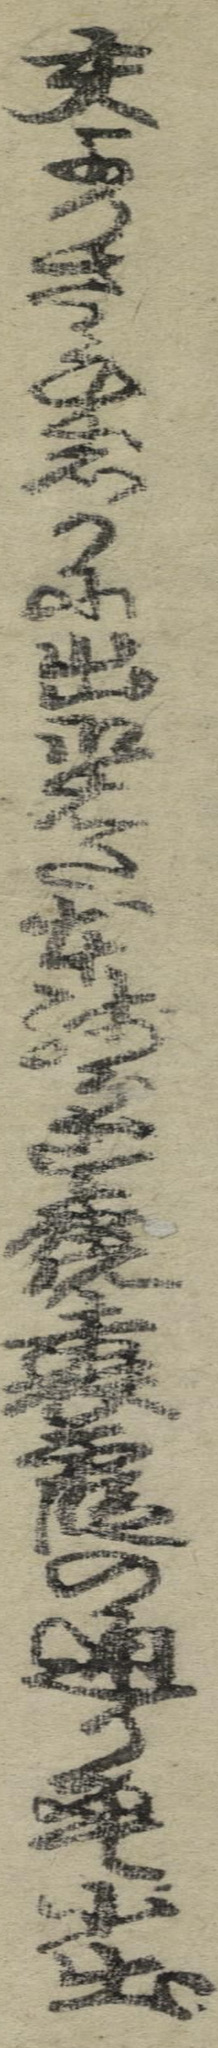夫よりさき出石の小出御はた本残らず焼裏霞の通りまて小出
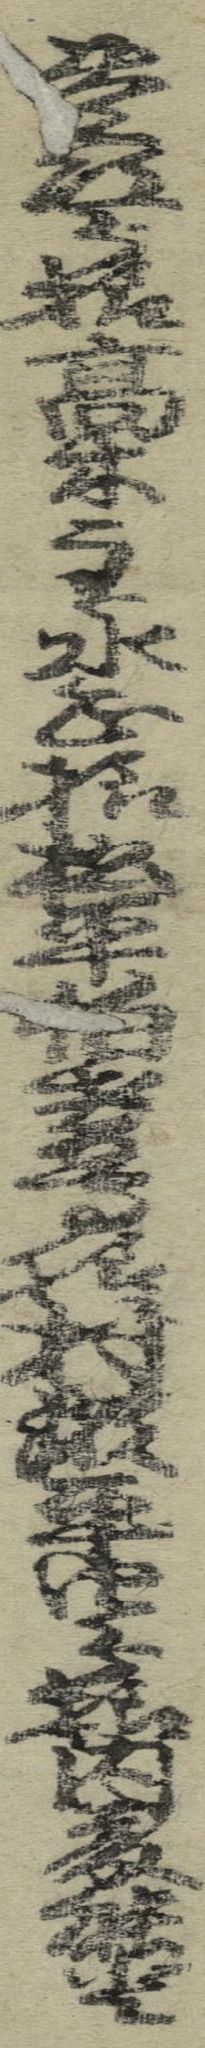豊後守様高木主水正様松平伯耆守様村瀬平次郎様内藤能登
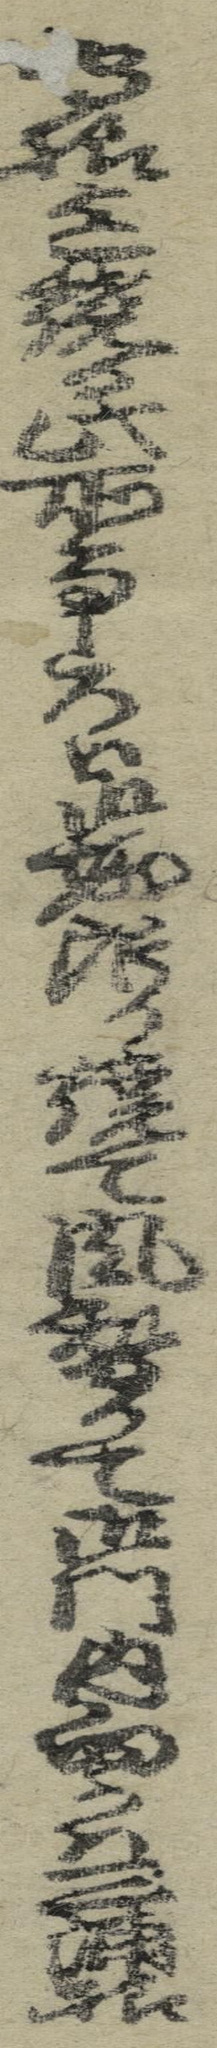守様迄焼る此所？？城限り焼て風替りて御門内向うは三浦様
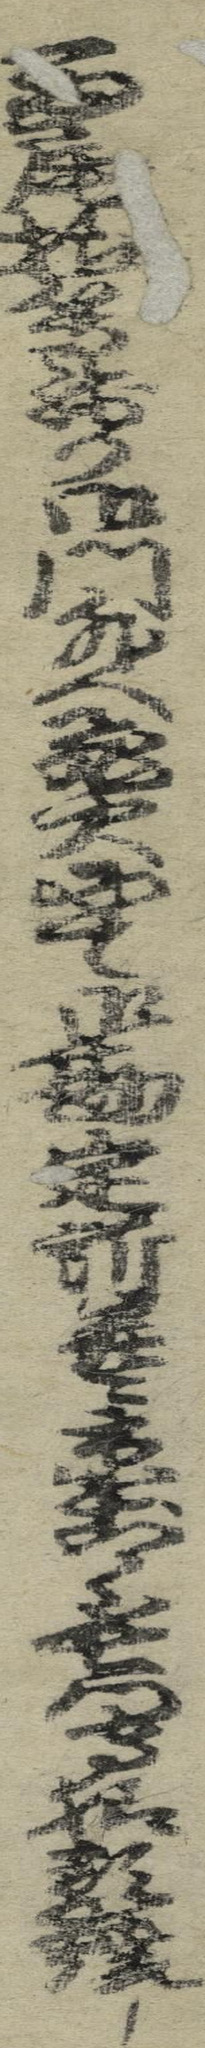西尾様等残り御門外へ飛火にて御勘定所？に京？長門守様類焼し
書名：[嘉永三年二月の江戸大火に関する瓦版]
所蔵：東京大学地震研究所図書室 Earthquake Research Institute Library, The University of Tokyo, JAPAN
